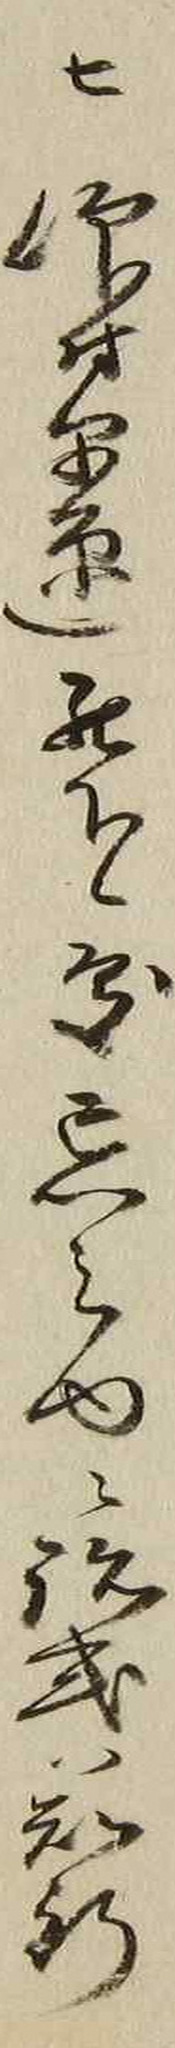被仰付早速罷下候処忌之内ニ跡式御知行
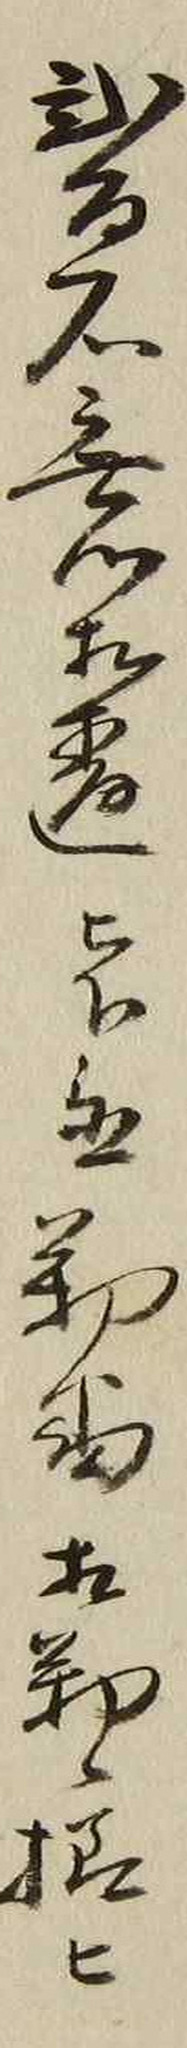弐百石無御相違被下置勤番相勤候様被
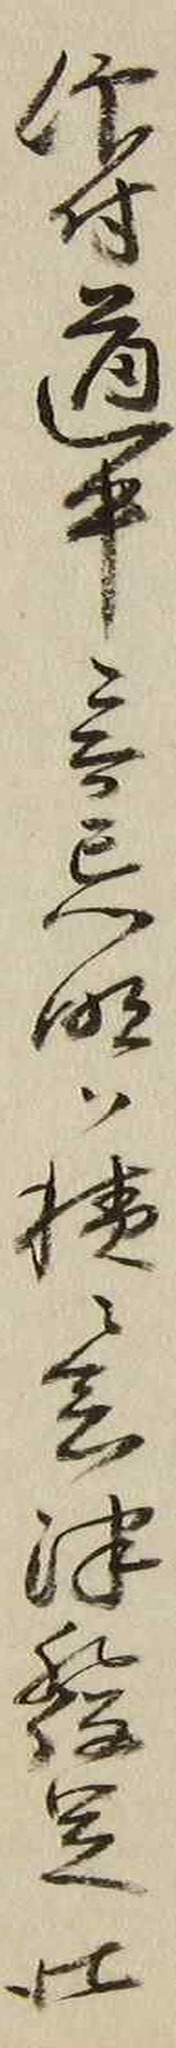仰付道中ニ而忌明御積ニ会津発足仕
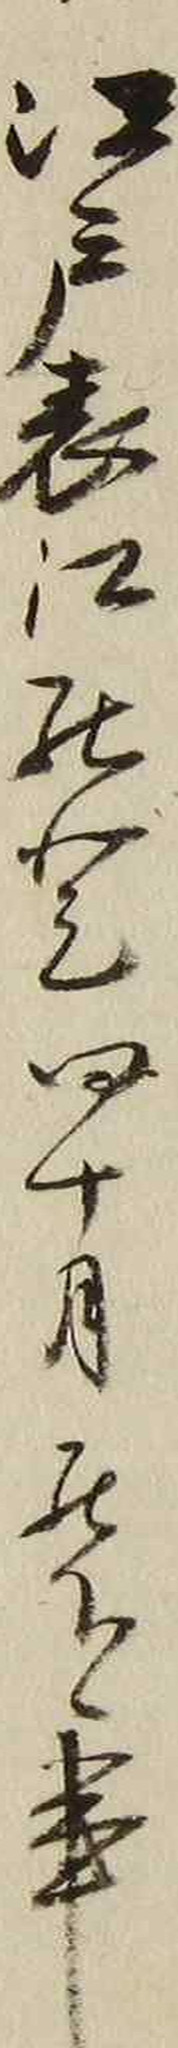江戸表江罷登同十月罷下候事
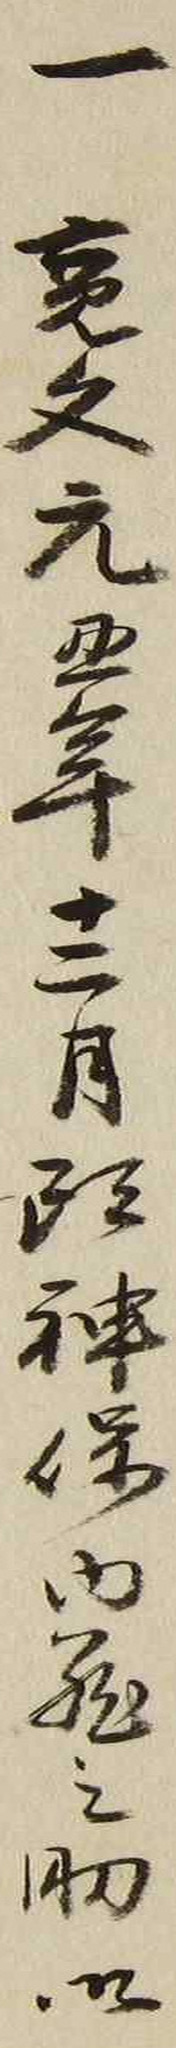一寛文元丑年十二月頭神保内蔵之助御
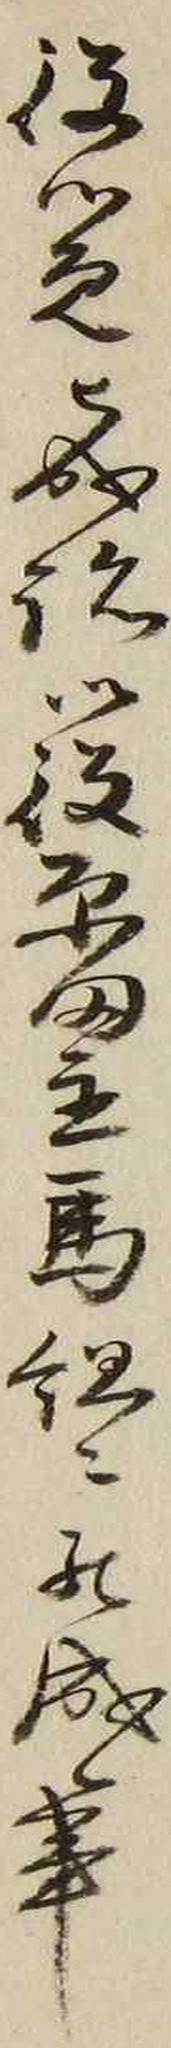役御免被成跡御役原田主馬組ニ罷成候事
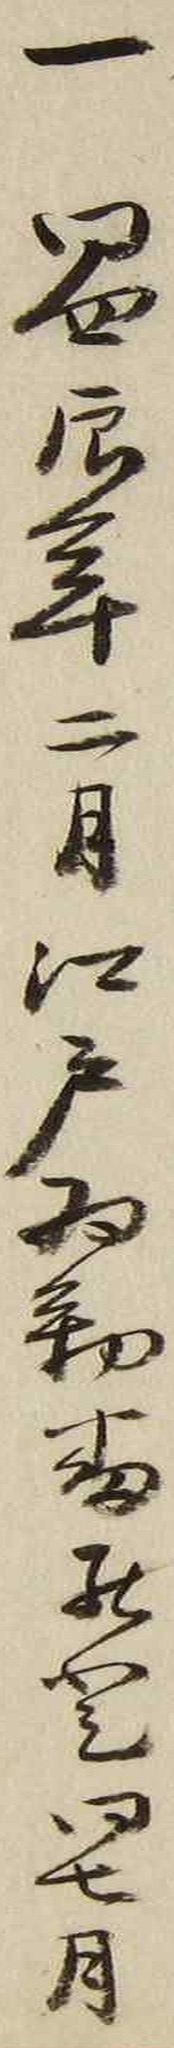一同四辰年二月江戸為勤番罷登同七月
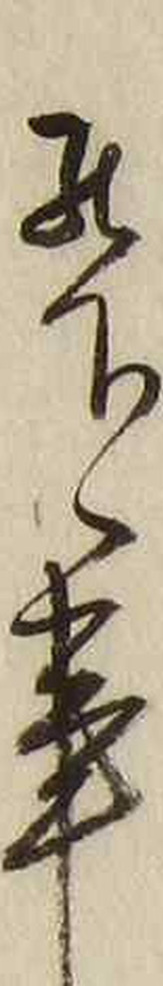罷下候事

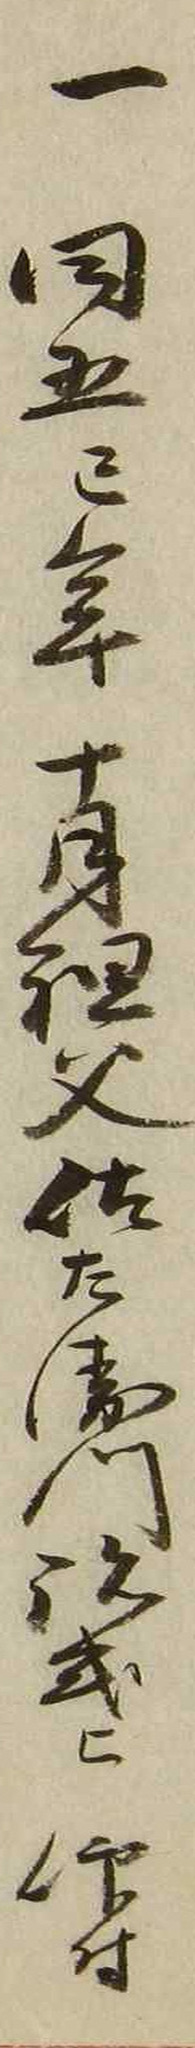一同五巳年十月祖父佐左衛門跡式被仰付
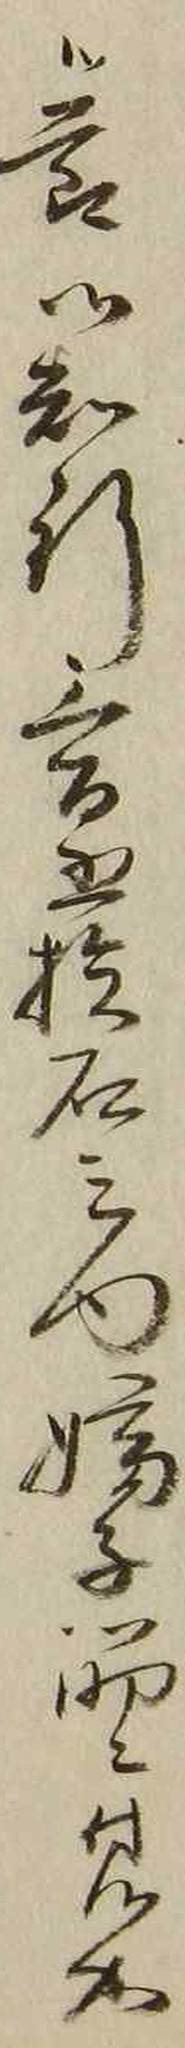候節御知行三百五拾石之内嫡子筋ニ付御加
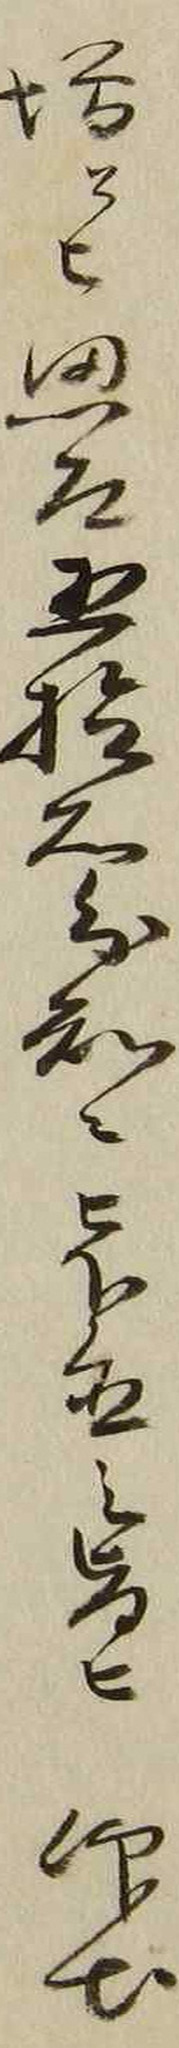増と被思召五拾石分知ニ被下置之旨被仰出
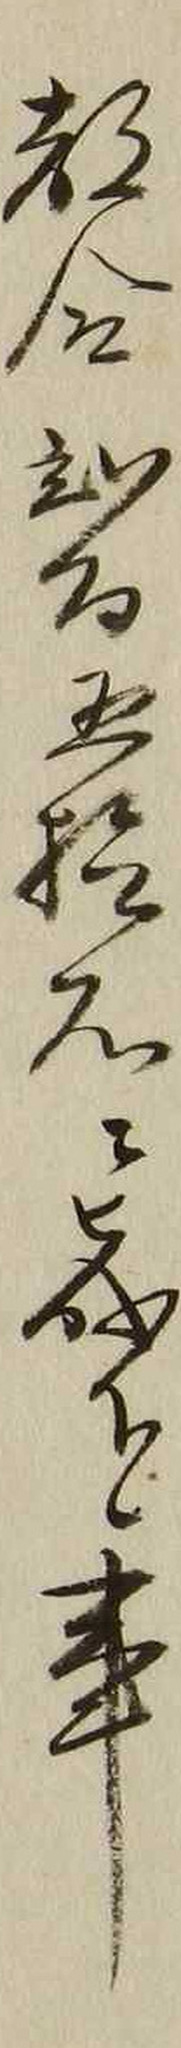都合弐百五拾石ニ被成下候事
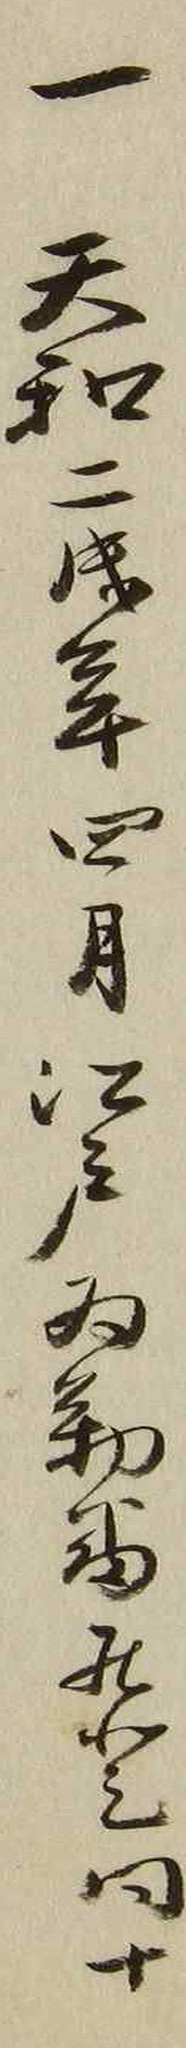一天和二戌年四月江戸為勤番罷登同十
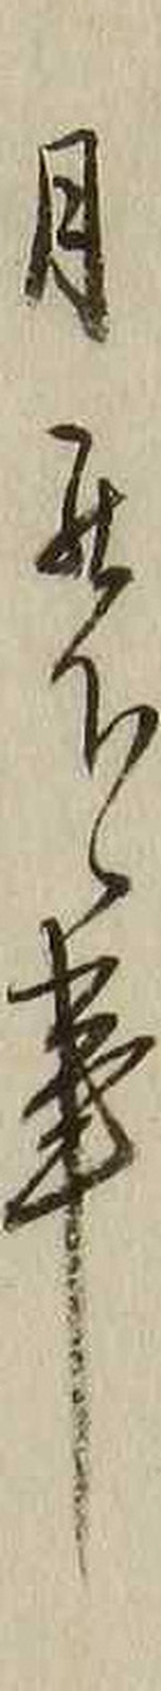月罷下候事
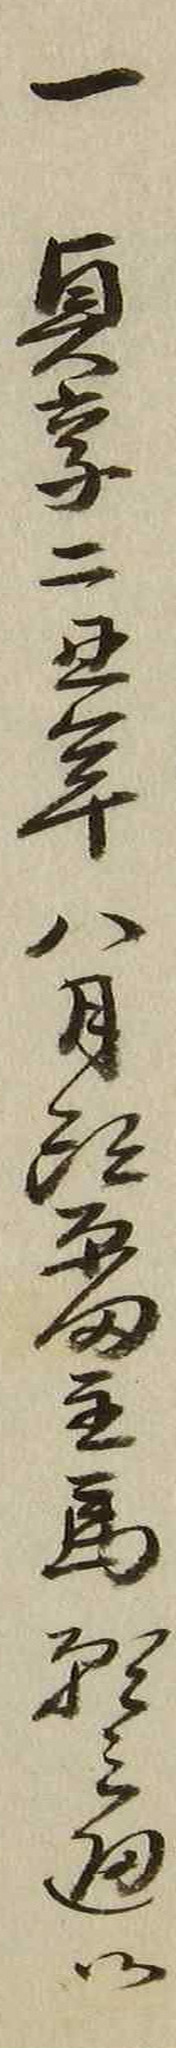一貞享二丑年八月頭原田主馬願之通御
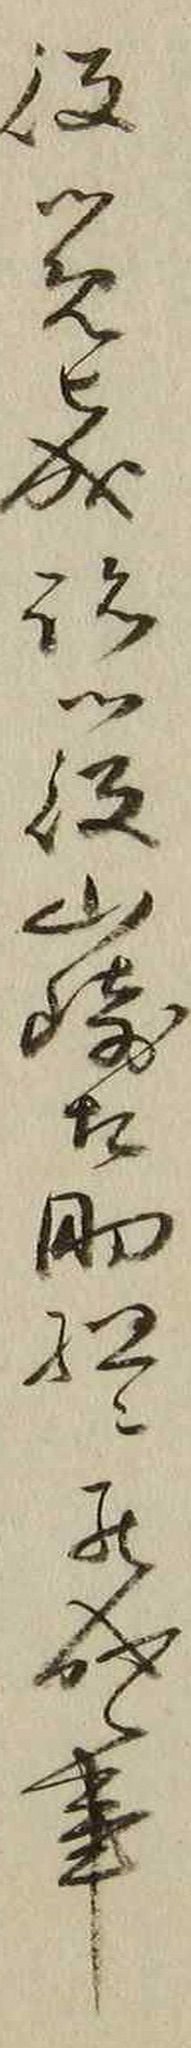役御免被成跡御役山崎左助組ニ罷成候事
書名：諸士系譜　巻之311　し之部1
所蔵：会津若松市立会津図書館
